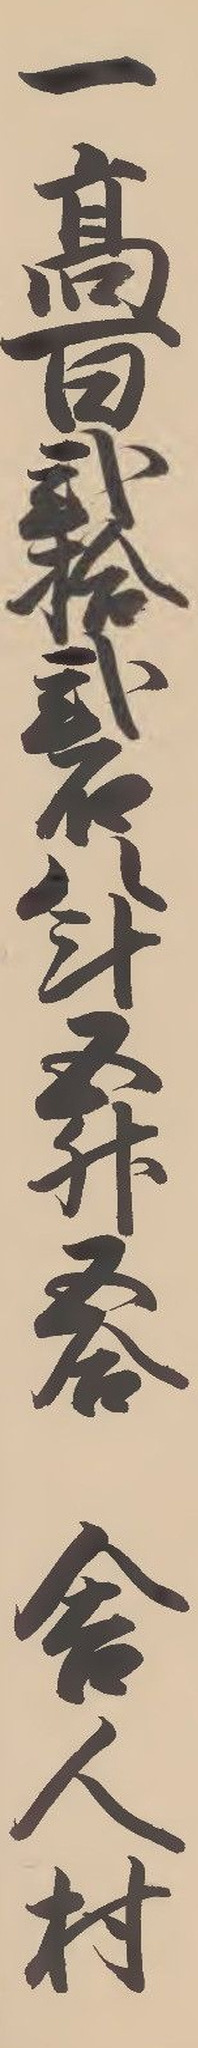一高百弐拾弐石八斗五升五合舎人村
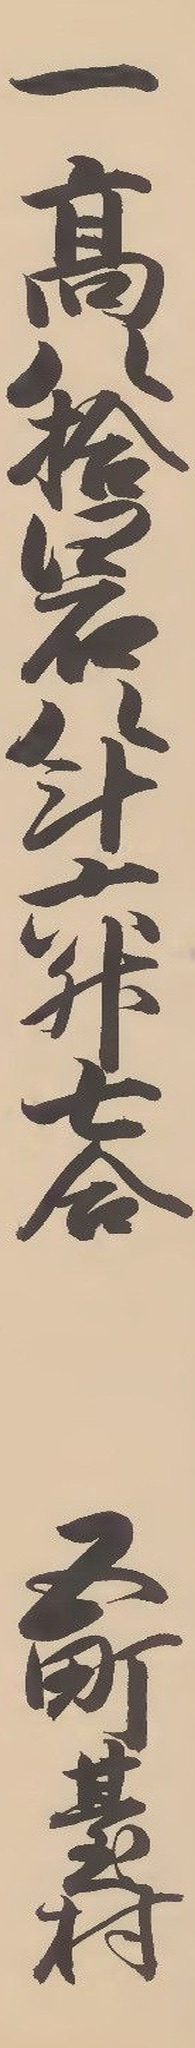一高八拾四石八斗六升七合五町台村
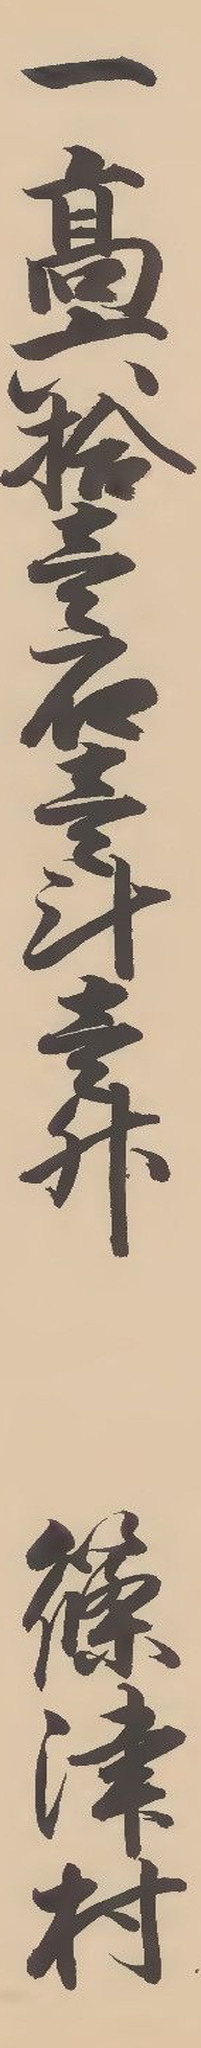一高六拾壱石壱斗壱升篠津村
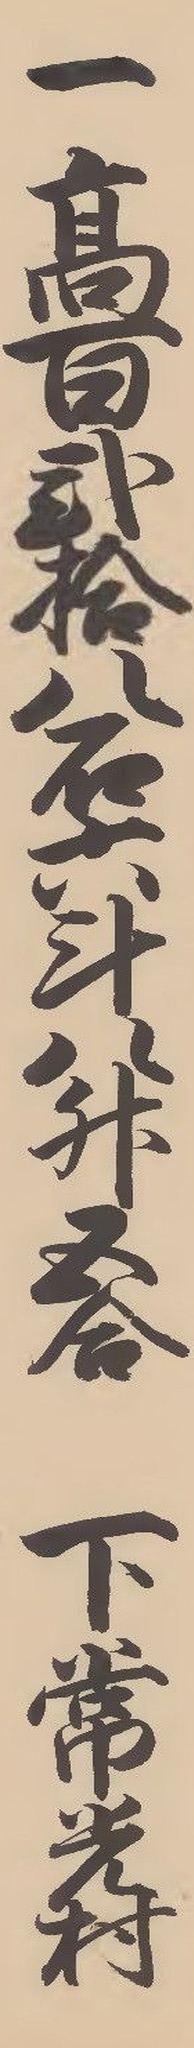一高百弐拾八石六斗八升五合下常光村
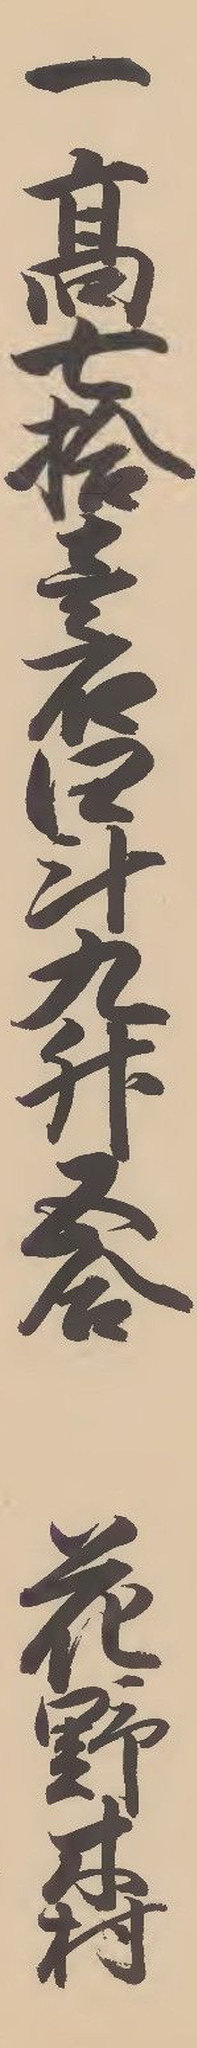一高七拾壱石四斗九升五合花野木村

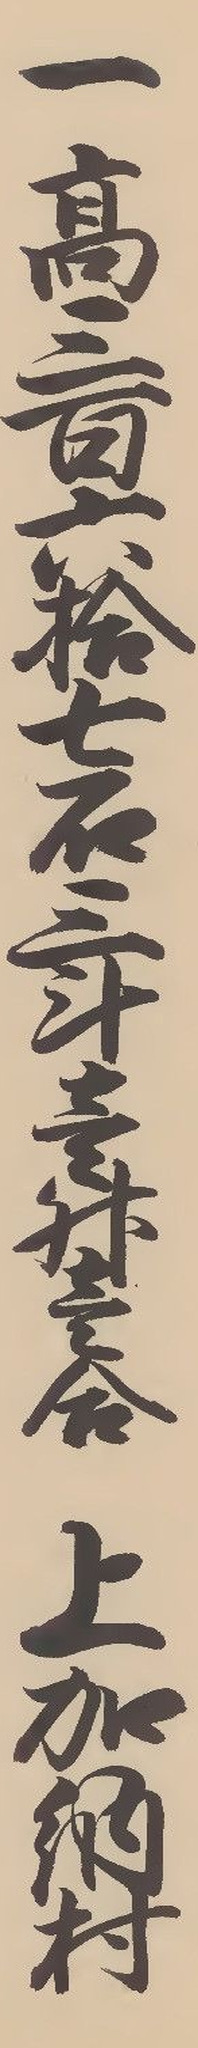一高三百六拾七石三斗壱升壱合上加納村
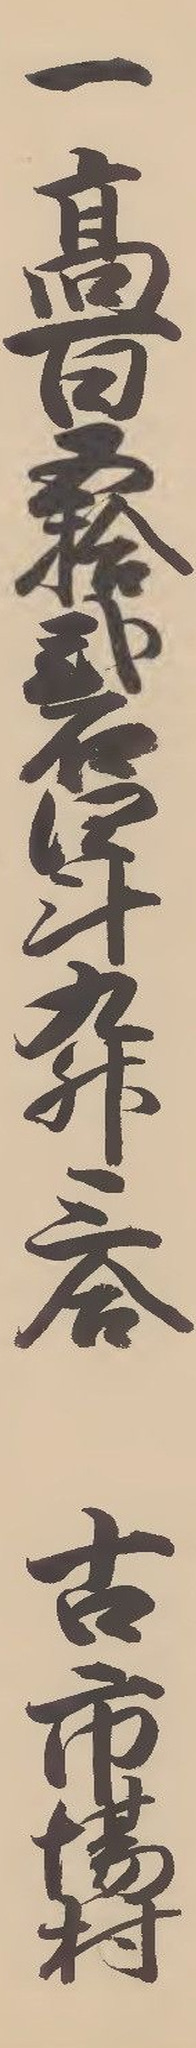一高百五拾弐石四斗九升三合古市場村
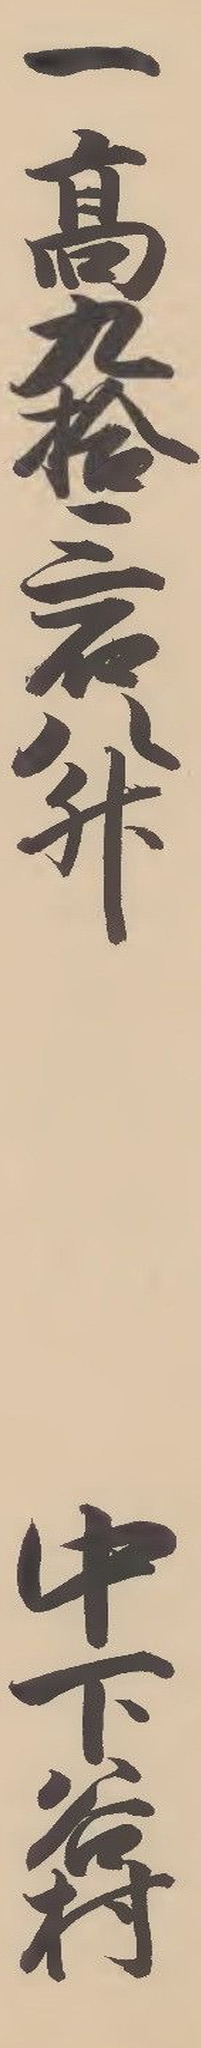一高九拾三石八升中下谷村
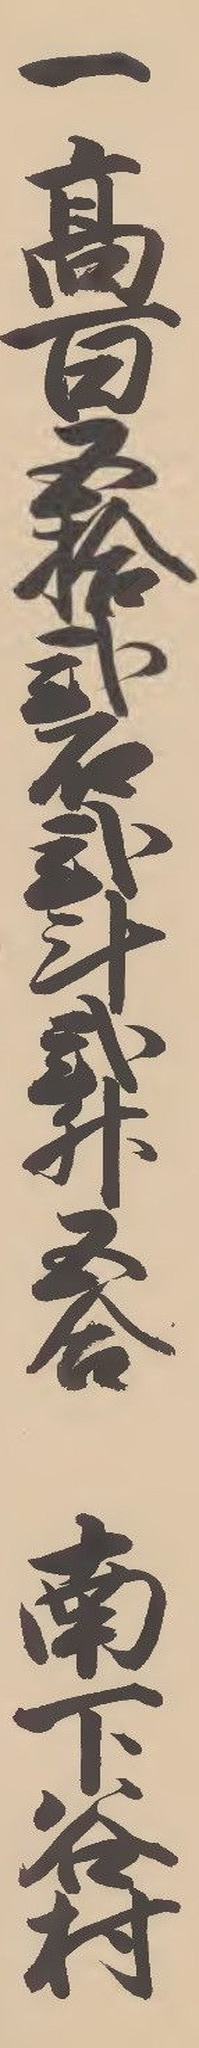一高百五拾弐石弐斗弐升五合南下谷村
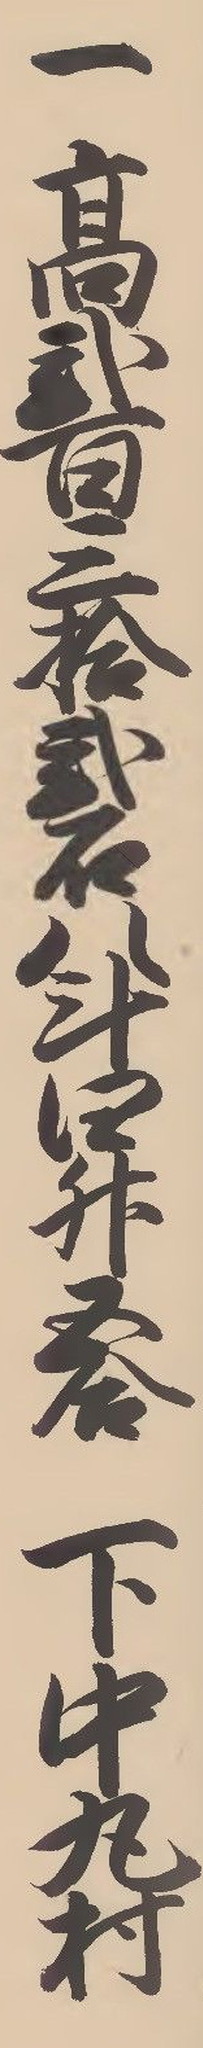一高弐百三拾弐石八斗四升五合下中丸村
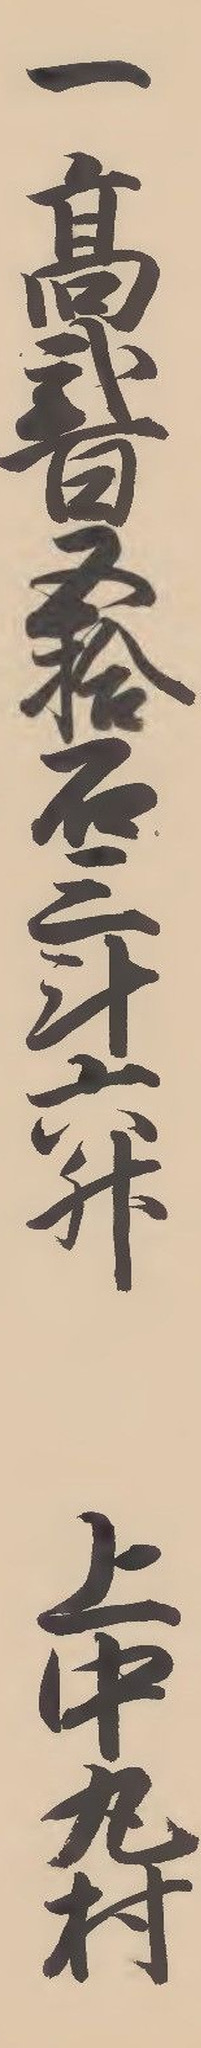一高弐百五拾石三斗六升上中丸村
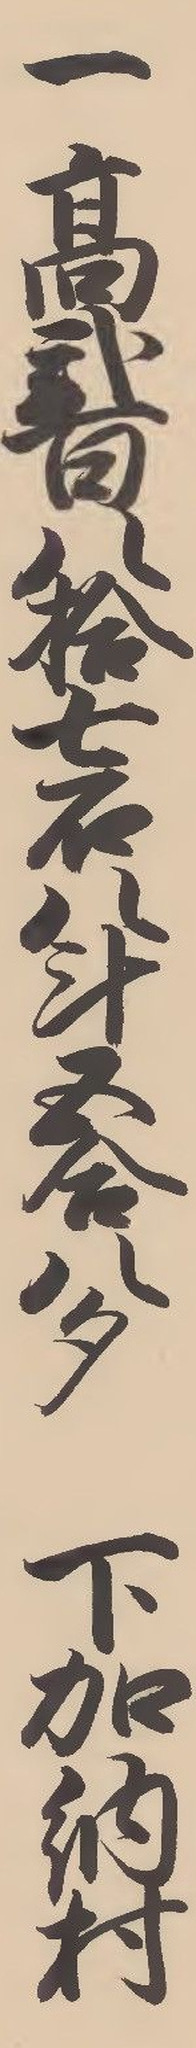一高弐百八拾七石八斗五合八勺下加納村
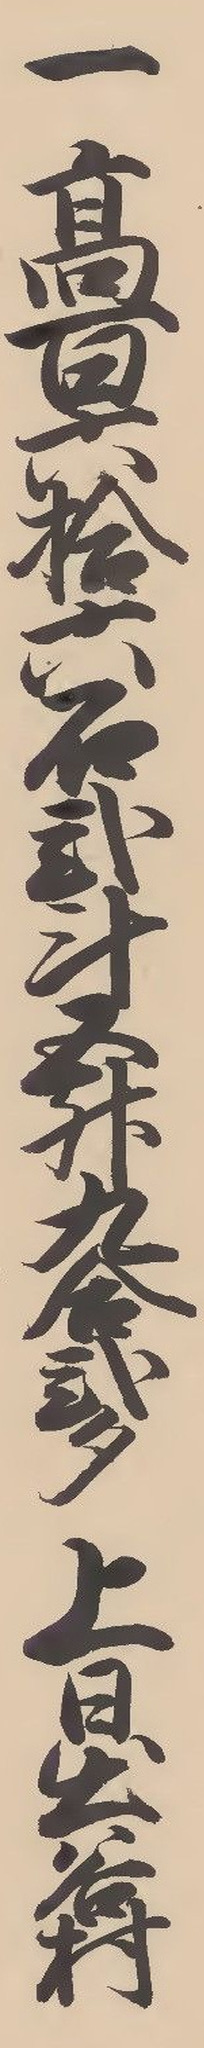一高百六拾六石弐斗五升九合弐勺上日出谷村

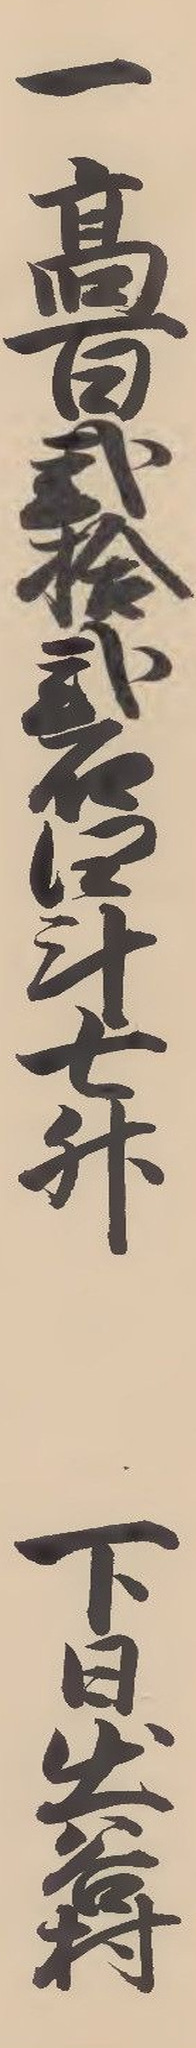一高百弐拾弐石四斗七升下日出谷村
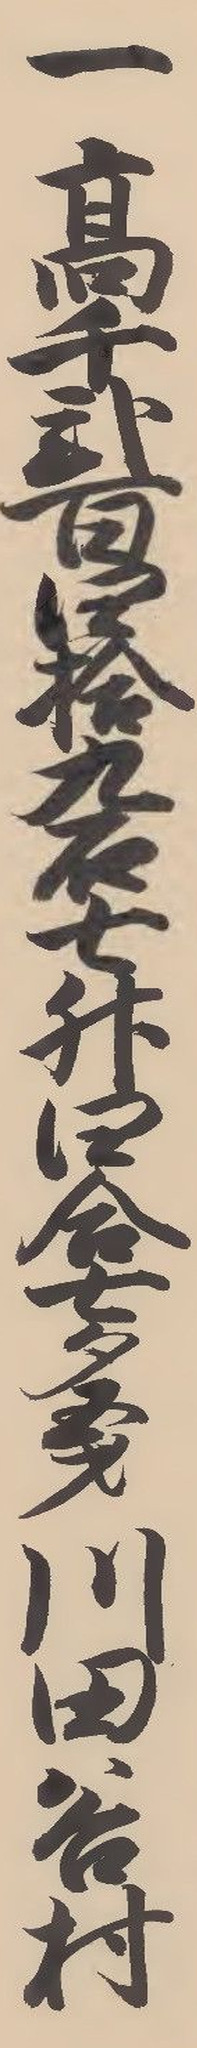一高千弐百四拾九石七升四合七勺五才川田谷村
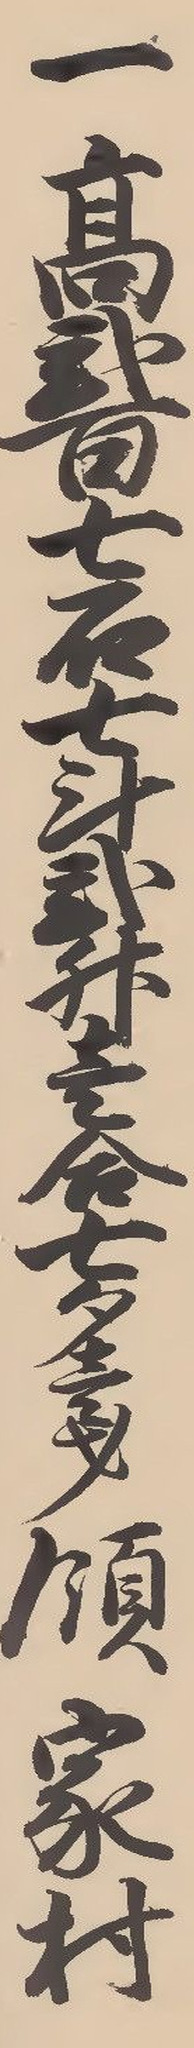一高弐百七石七斗弐升壱合七勺壱才領家村
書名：武蔵国郷帳　下
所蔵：国立公文書館 National Archives of Japan
